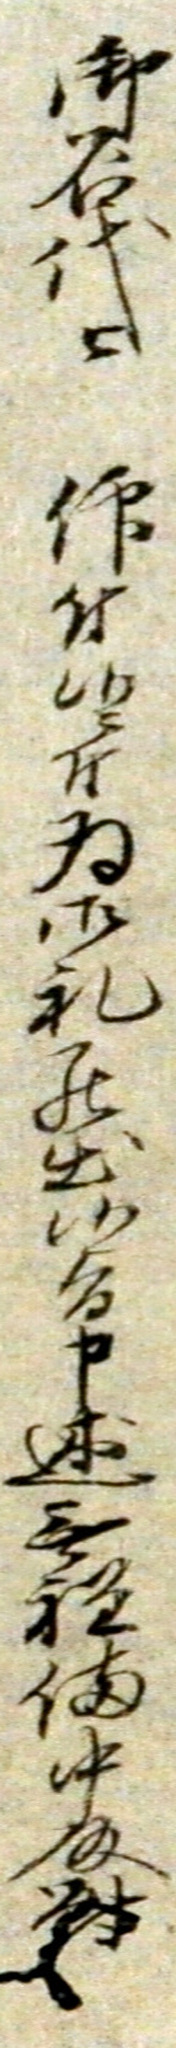御名代被仰付候ニ付為御礼罷出候旨申述無程備中殿対
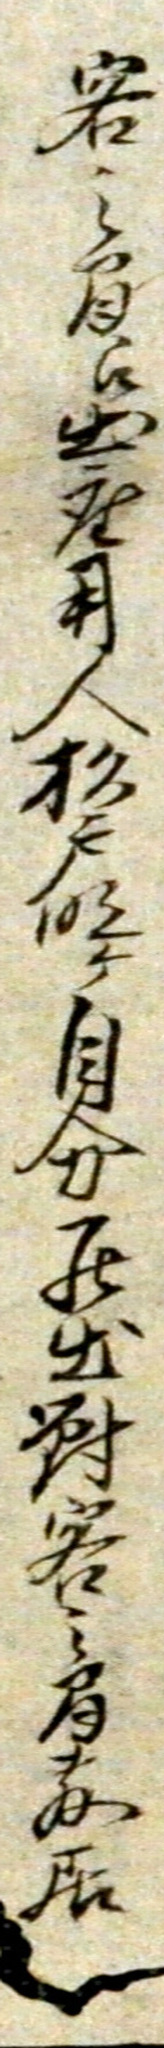客之間江出座用人杉戸明ヶ自分罷出対客之敷居
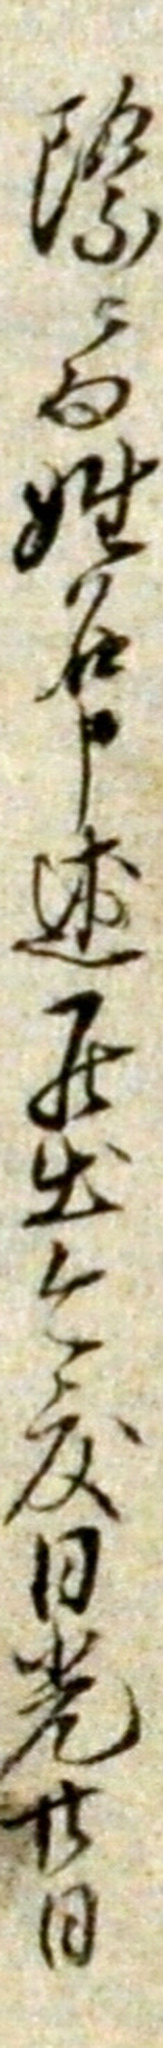際ニ而姓名申述罷出今度日光廿日
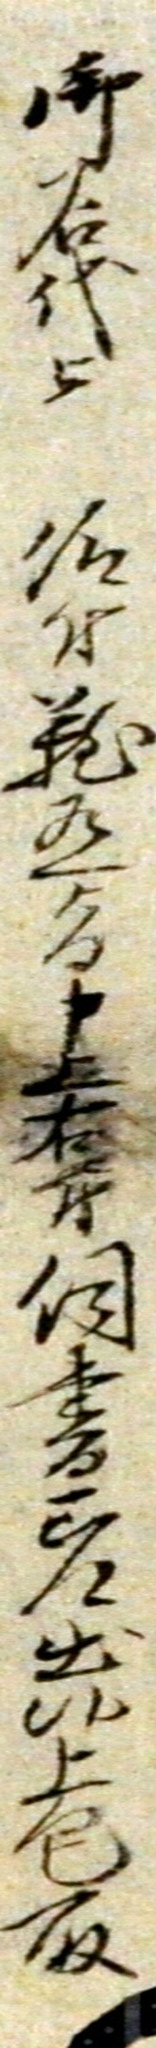御名代被仰付難有旨申上右ニ付伺書差出候上包取
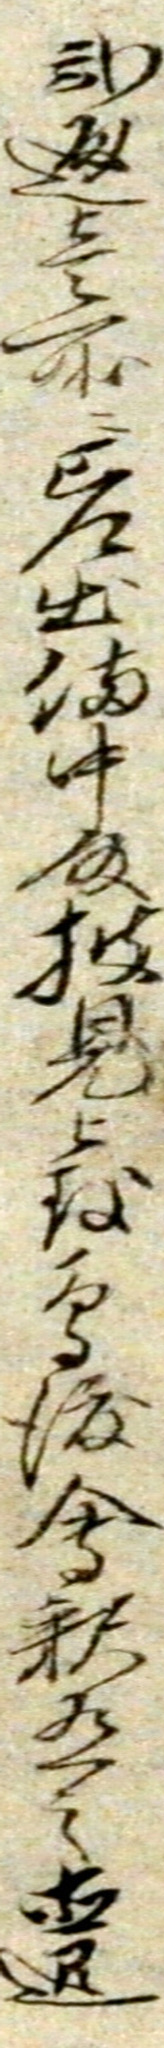弐通壱所ニ差出備中殿披見被致鳥渡会釈有之直退
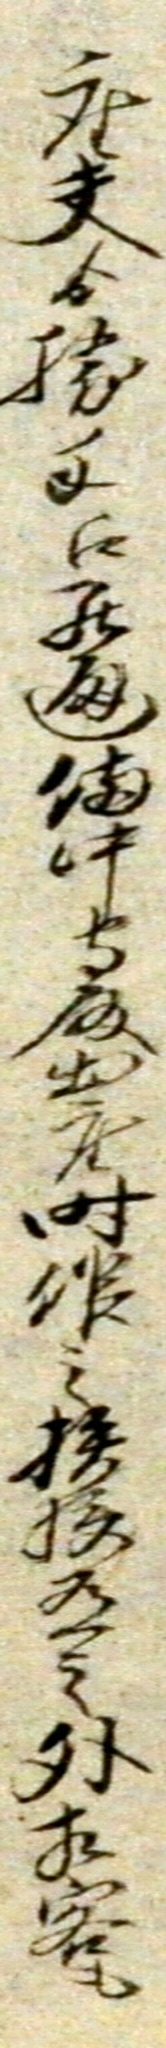座夫ゟ勝手江罷通備中守殿出座時候之挨拶有之外相客も
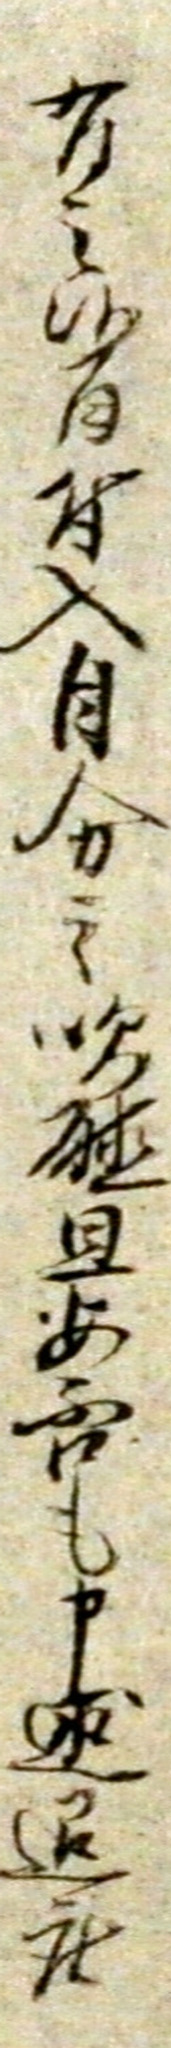有之候間付入自分之吹聴且安否も申述退座
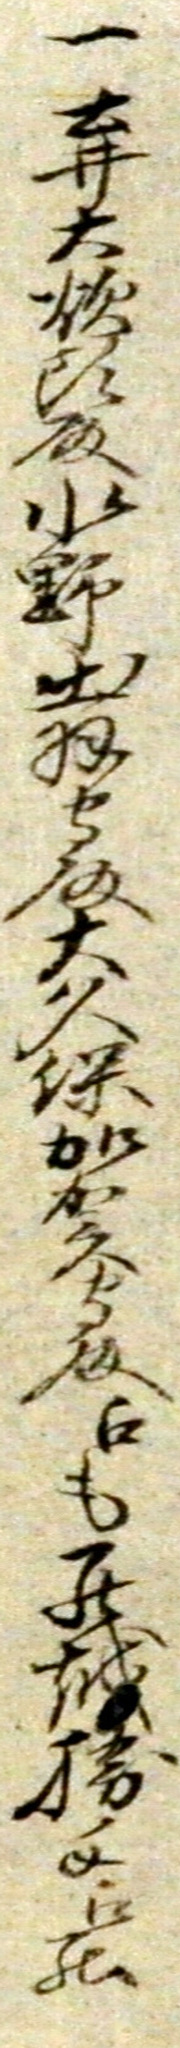一土井大炊頭殿水野出羽守殿大久保加賀守殿江も罷越勝手江罷
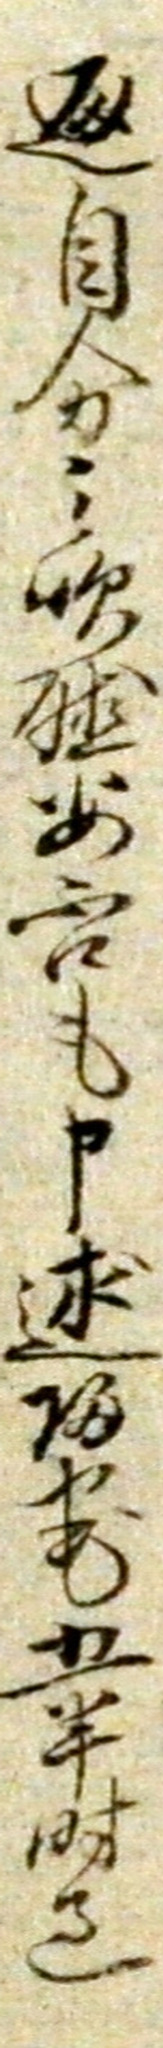通自分之吹聴安否も申述帰宅五半時過
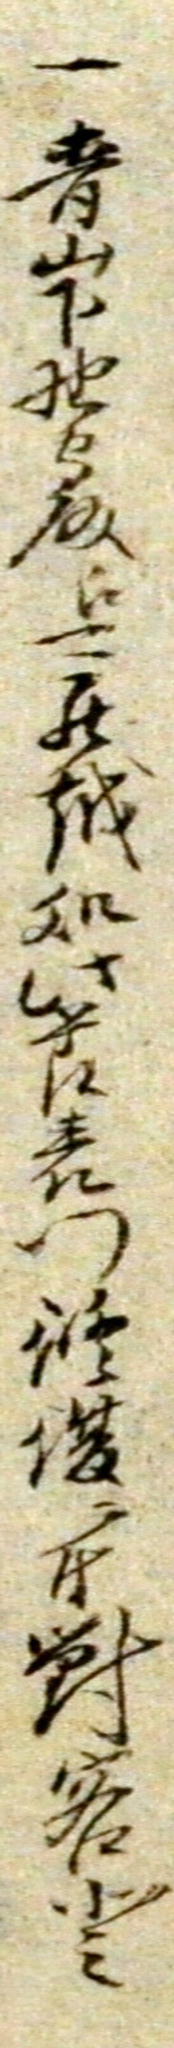一青山下野守殿江可罷越処此節表門修復ニ付対客登
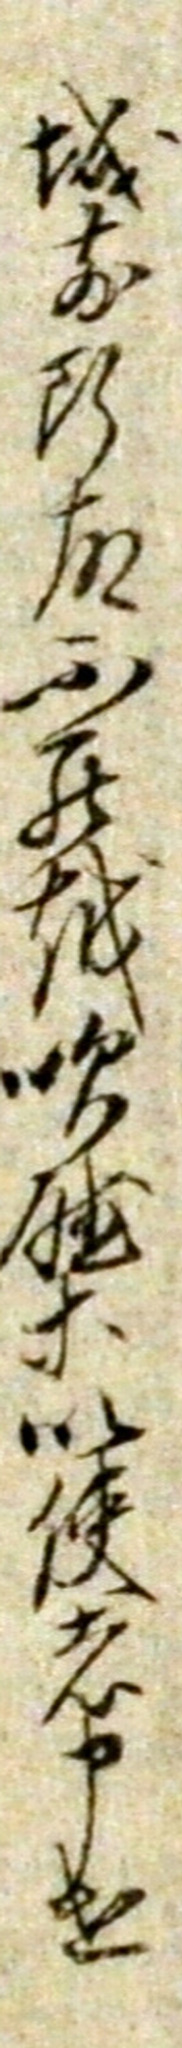城前段故不罷越吹聴等以使者申遣
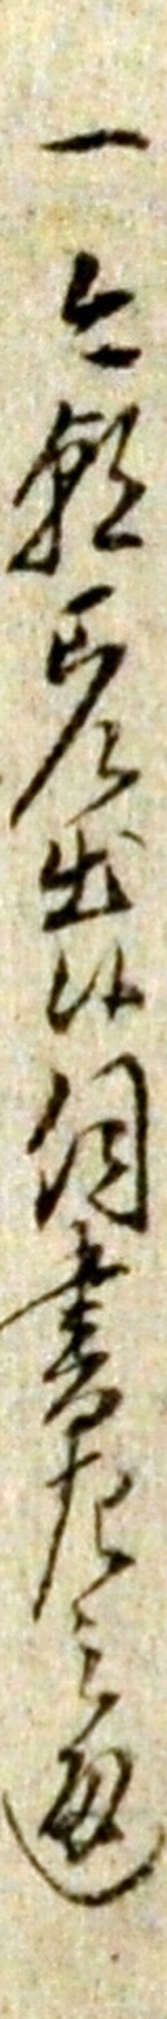一今朝差出候伺書左之通
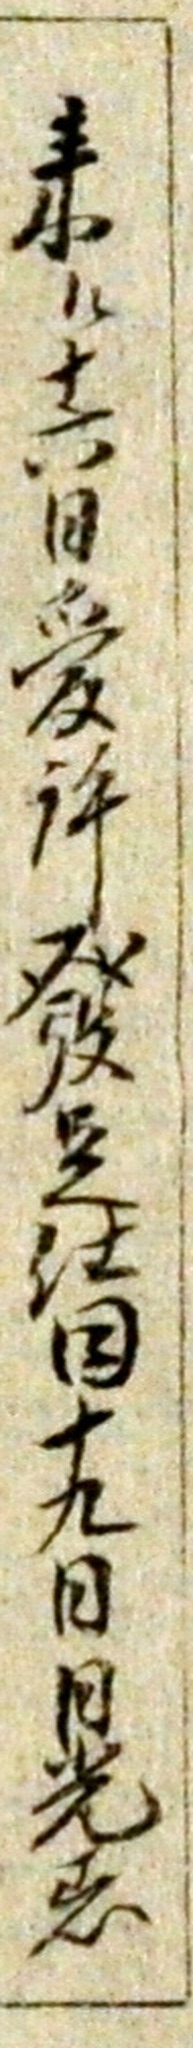来ㇽ十六日爰許発足仕同十九日日光着
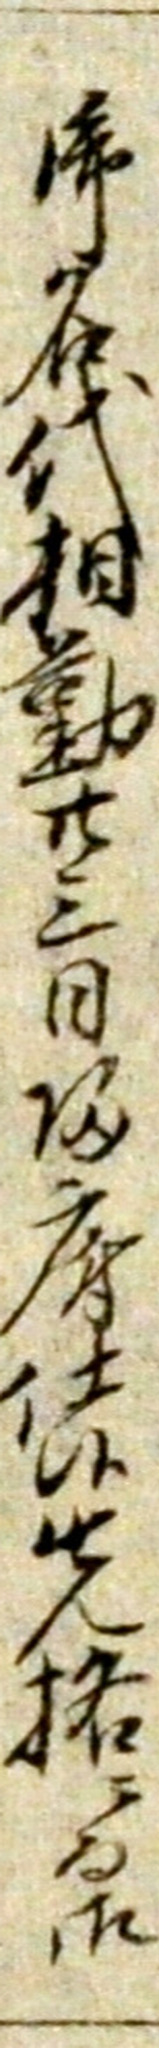御名代相勤廿三日帰府仕候先格ニ而御
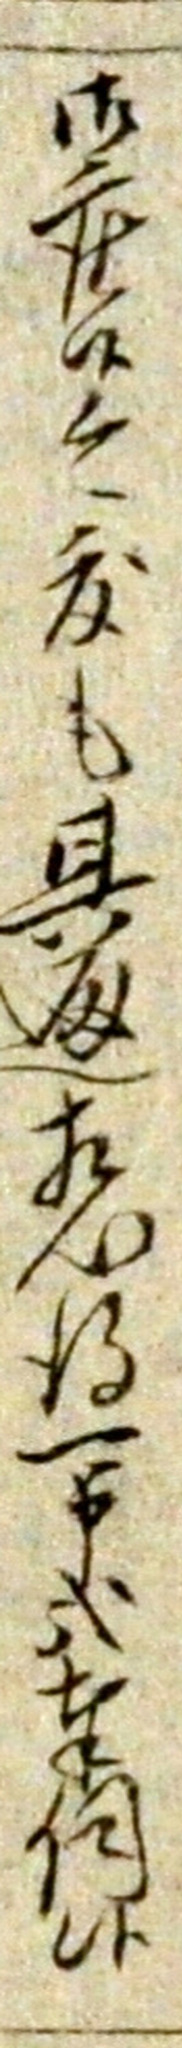御座候今度も其通相心得可申哉奉伺候
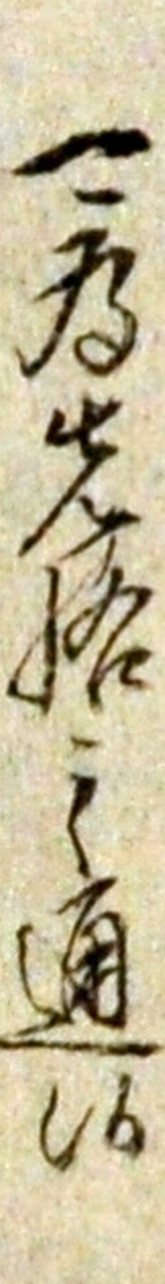可為先格之通候
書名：日光御名代相勤候節ノ留
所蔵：伊那市立高遠町図書館・合同会社AMANE
